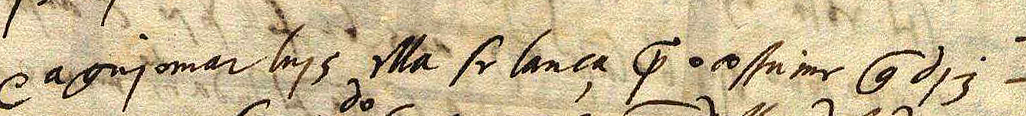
e a gujomar lujs ella se lança p̄o o costume q̄ djz
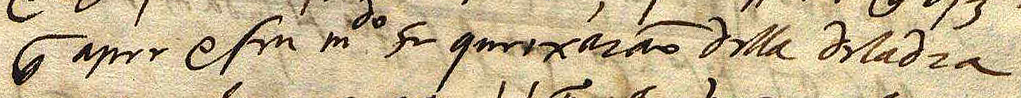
q̄ a ree e seu mdo se queixarão della de ladra
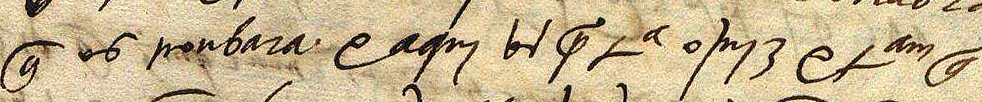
q̄ os roubara. e aquj vē p̄o ta o Juiz e tam q̄
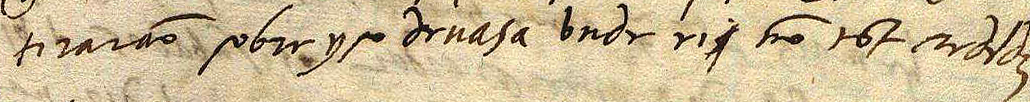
tiraraõ sobre yso deuasa vnde ei nō est credēdꝫ
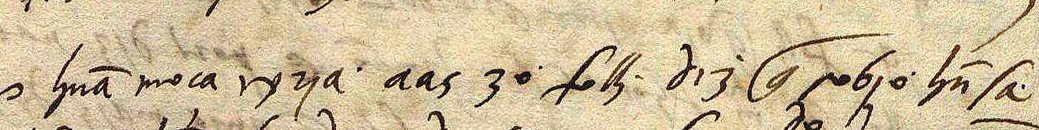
e huā moça eyrja. aas 30 folh. diz q̄ sobjo hū sa
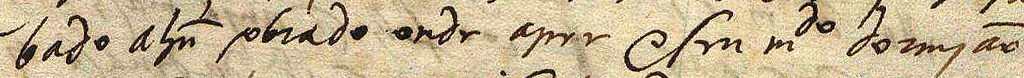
bado a hū sobrado onde a rre e seu mo dormjão
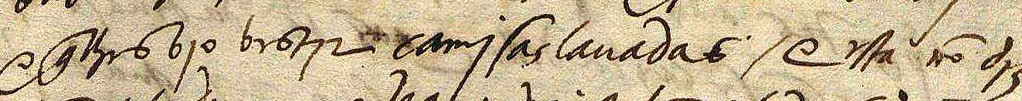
e q̄ lhes vjo vestjr camjsas lauadas / e esta nō djz
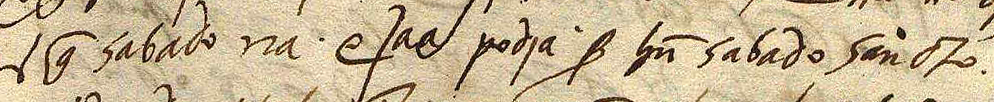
ē q̄ sabado era. e Jaa podja ꞩ hū sabado Sancto
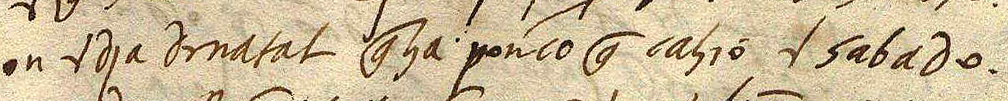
ou ē dja de natal q̄ ha pouco q̄ cahio ē sabado.
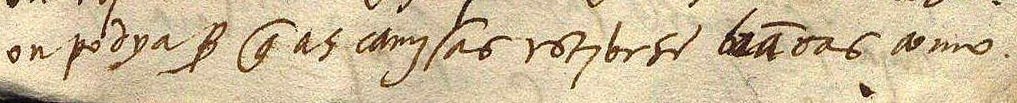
ou podya ꞩ q̄ as camjsas estjvesē brācas como
